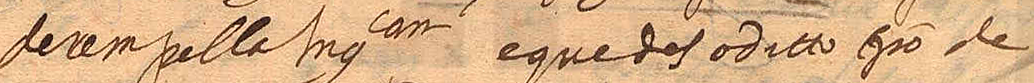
derem pella Inqcam e que des o ditto tpō de
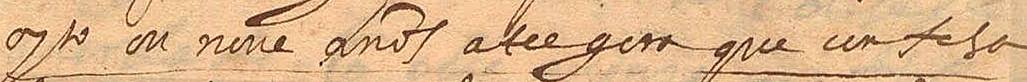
oyto ou nove anōs atee gora que confesa
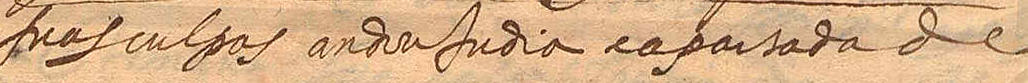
suas culpas andou Judia e apartada de
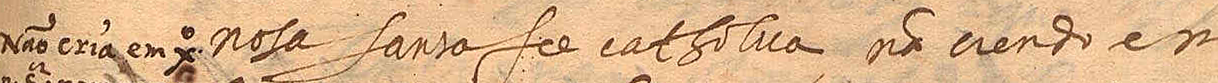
nosa santa fee catholica, nā crendo em
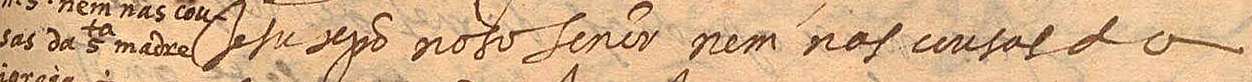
Jesu xpō noso senōr nem nas cousas da
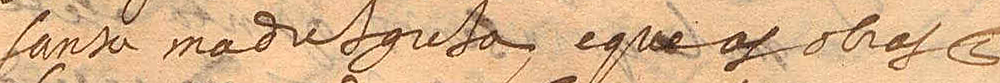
santa madre Jgreja, e que as obras q̄
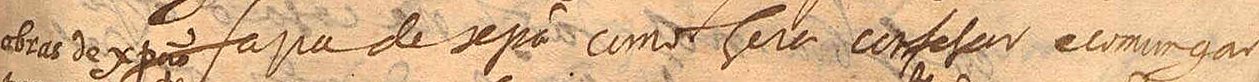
fazia de xpā como hera confesar e comungar
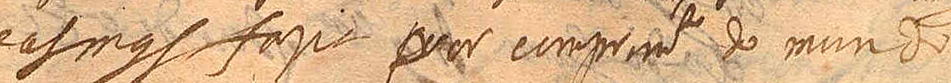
e as majs fazia por comprimto do mundo
